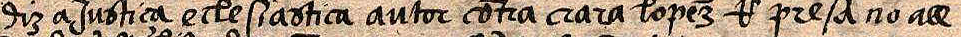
diz a Justiça eclesiastica autor cōtra crara lopez̄ R presa no all
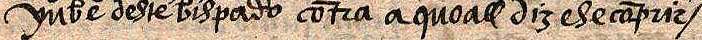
Yube deste bispado cōtra a quoall diz e se cōprir/
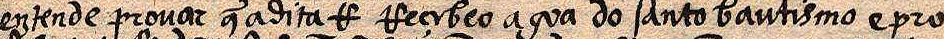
emtende prouar q̄ a dita R Reçebeo agoa do santo bautismo e pro
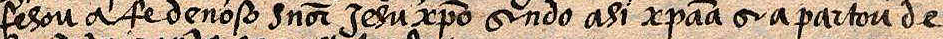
fesou a fe de noso Snōr Jesu xp̄o sendo asi xpāa se apartou de
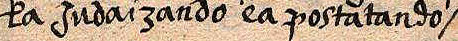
la Judaizando e apostatando/
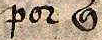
por q̄
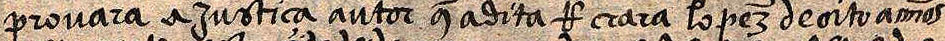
prouara a Justiça autor q̄ a dita R crara lopez̄ de oito ann̄os
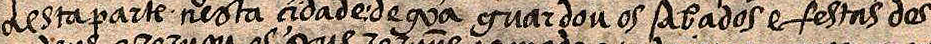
a esta parte nesta çidade: de goa guardou os sabados e festas dos
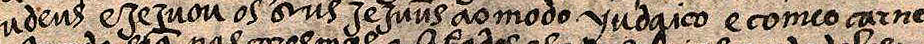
Judeus e JeJuou os seus JeJuūs ao modo Yudaico e comeo carne
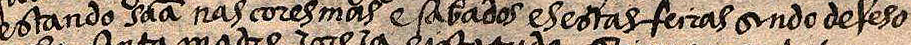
estando saā nas coresmas e sabados e sestas feiras sendo defeso
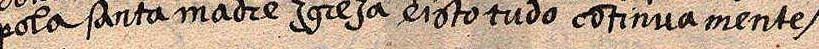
pola santa madre JgreJa e isto tudo cōtinuamente/
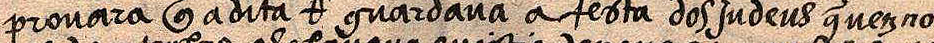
prouara q̄ a dita R guardaua a festa dos Judeus q̄ uem no
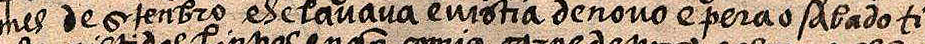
mes de setenbro e se lauaua e uistia de nouo e pera o sabado ti
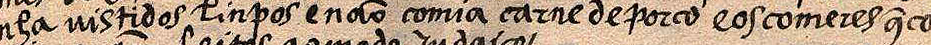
nha uistidos linpos e naõ comia carne de porco e os comeres q̄ co
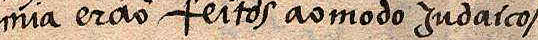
mia eraõ feitos ao modo Judaico/
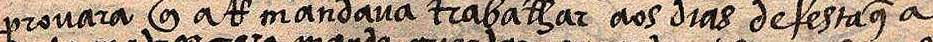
prouara q̄ a R mandaua trabalhar aos dias de festa q̄ a
